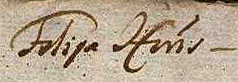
Felipa Hen̄s -
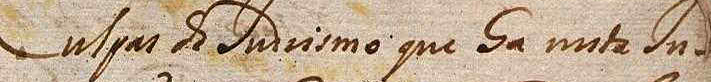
Culpas de Iudaismo que ha nesta In
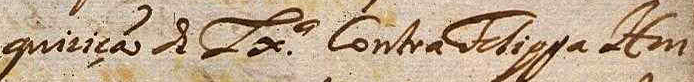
quizição de Lx.a Contra Felippa Hen
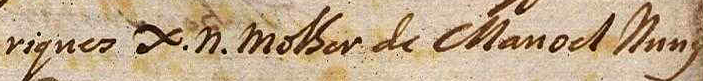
riques x. n. molher de Manoel Nunes
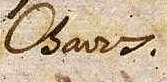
Chaves.
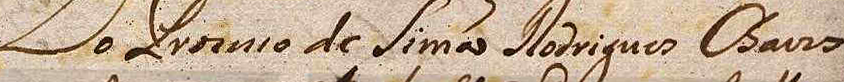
Do Prosesso de Simão Rodrigues Chaves
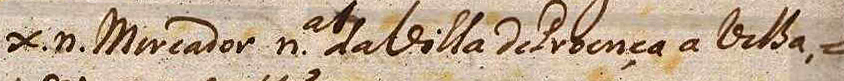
x. n. Mercador n.al da Villa de Proença a Velha,
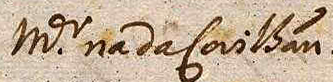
m.or na da Covilhãn.
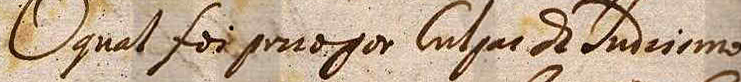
O qual foi preso por Culpas de Iudaismo
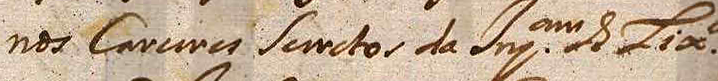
nos Carceres Serectos da Inq.am de Lix.a
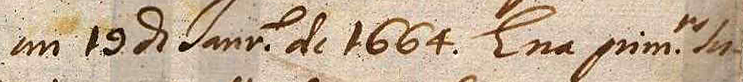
em 19 de Ianr.o de 1664. E na prim.ra ses
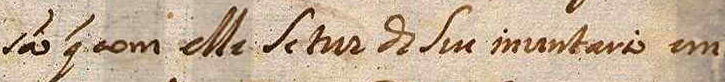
são q̄ com elle Se teve de Seu inuentario em
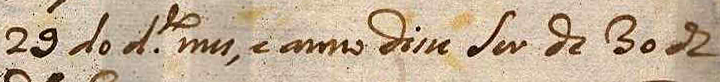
29 do d.to mes, e anno disse Ser de 30 de
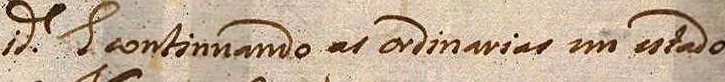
id.e E continuando as ordinarias em estado
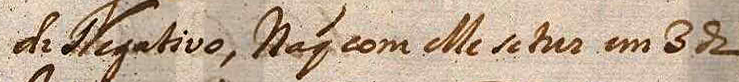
de Negativo, Na q̄ com elle se teve em 3 de
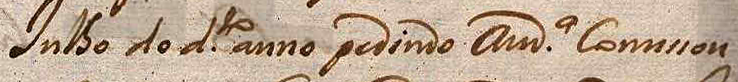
Iulho do d.to anno pedindo aud.a Comessou
